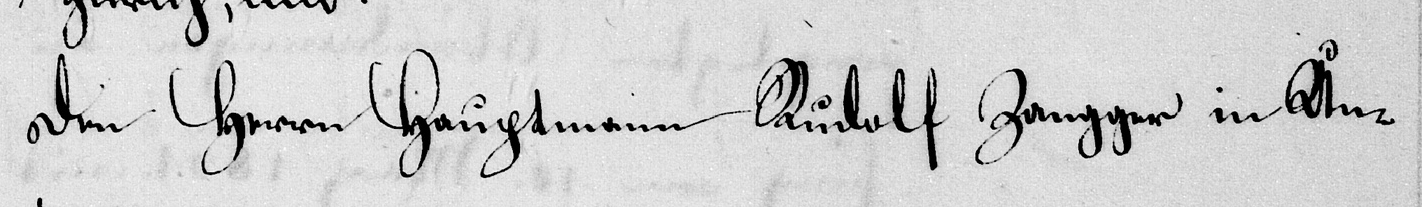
Den Herrn Hauptmann Rudolf Zangger in Un¬
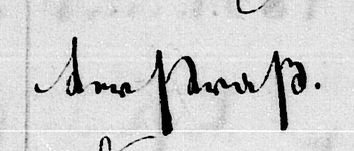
terstraß.
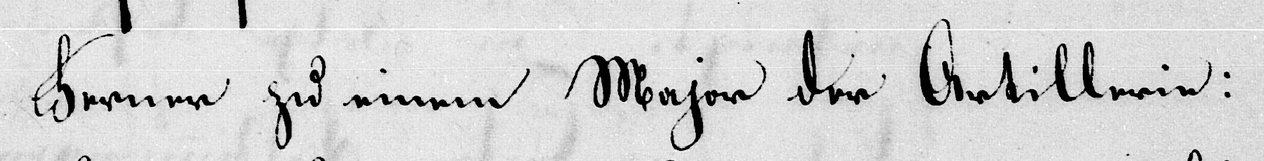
Ferner zu einem Major der Artillerie:
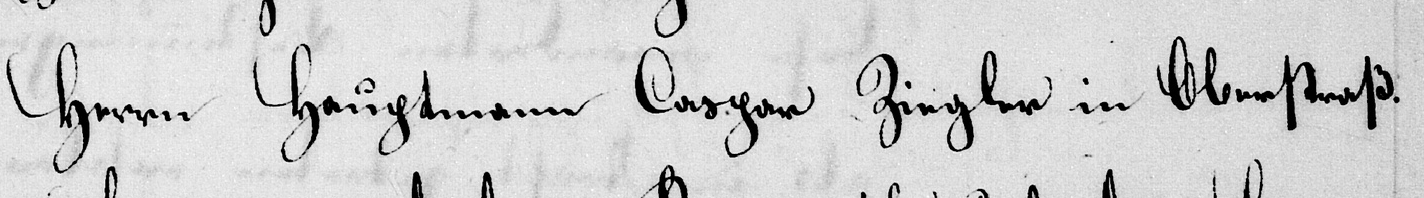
Herrn Hauptmann Caspar Ziegler in Oberstraß.
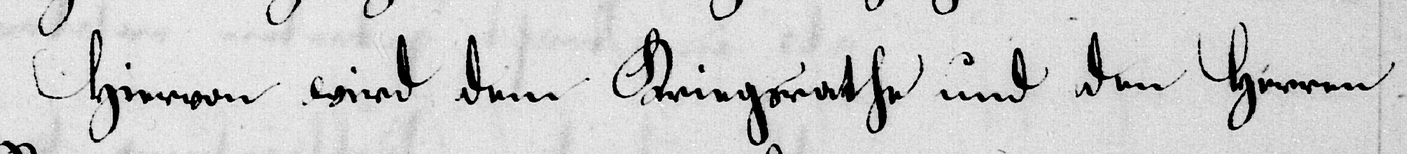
Hievon wird dem Kriegsrathe und den Herren
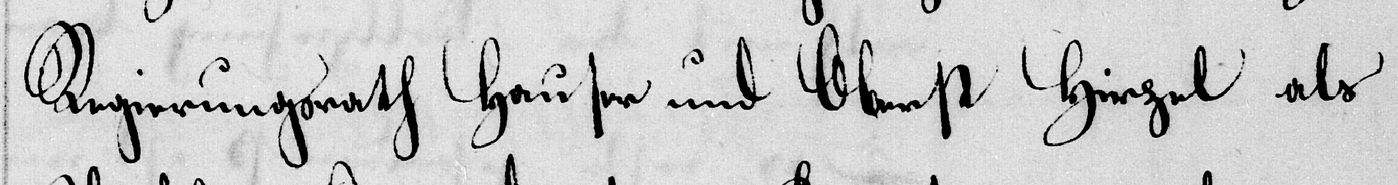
Regierungsrath Hauser und Oberst Hirzel als
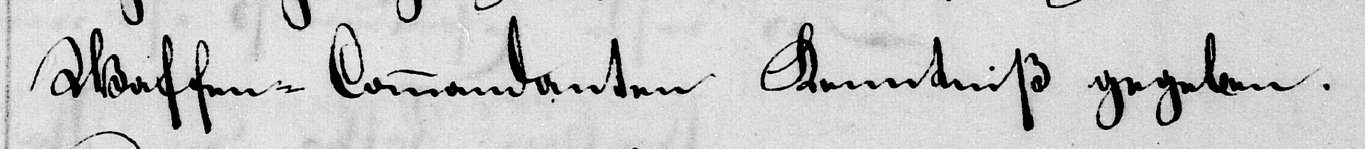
Waffen-Commandanten Kenntniß gegeben.
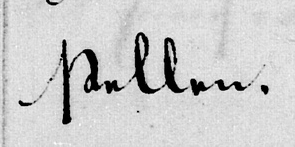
stellen.
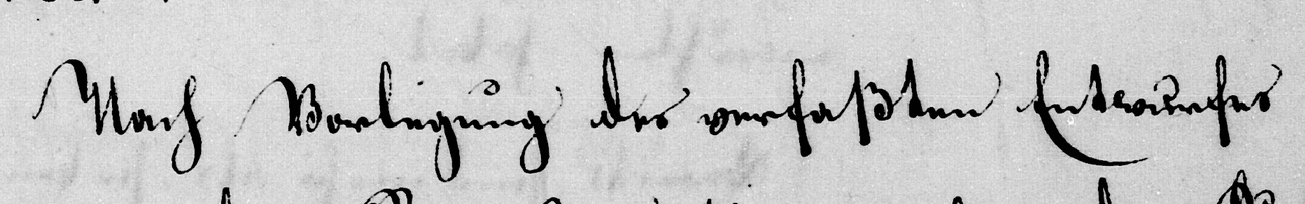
Nach Vorlegung des verfaßten Entwurfes
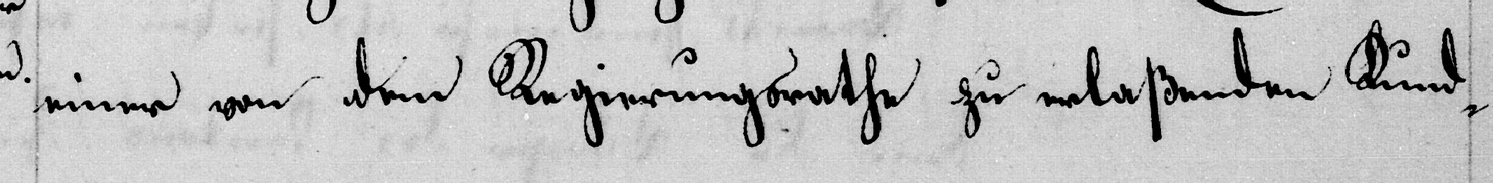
einer von dem Regierungsrathe zu erlaßenden Kund-
